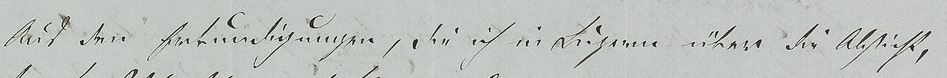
Mit den Erkundigungen, die ich in Luzern über die Absicht,
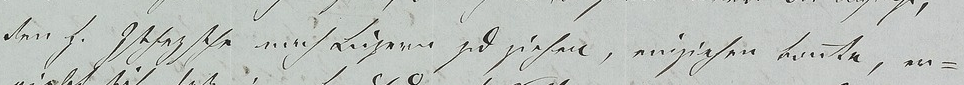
den H. Zschezsche nach Luzern zu ziehen, einziehen konnte, er-
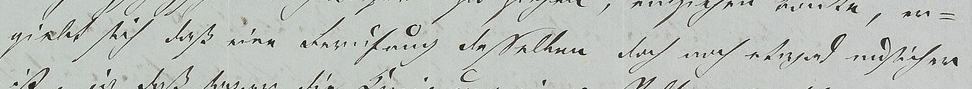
giebt sich daß eine Berufung desselben doch noch etwas unsicher
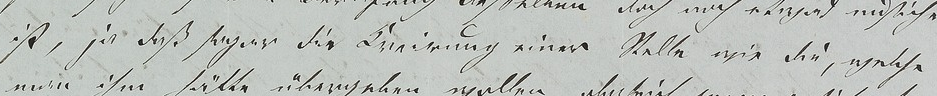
ist, ja dass sogar die Kreirung einer Stelle wie die, welche
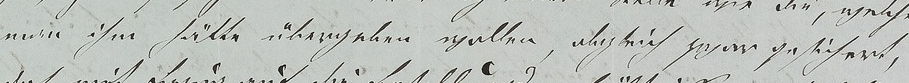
man ihm hätte übergeben wollen, obgleich zwar gesichert,
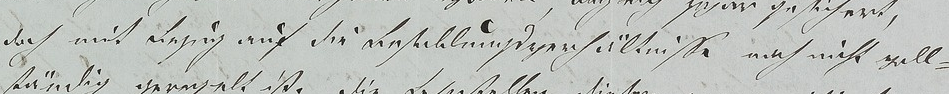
doch mit Bezug auf die Besoldungsverhältnisse noch nicht voll-
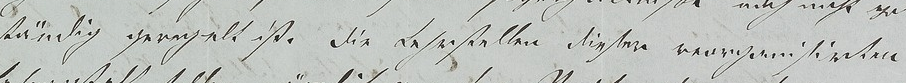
ständig geregelt ist. Die Lehrstellen dieser reorganisirten
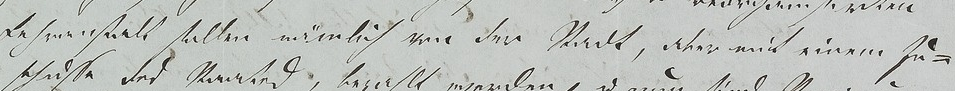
Lehranstalt sollen nämlich von der Stadt, aber mit einem Zu-
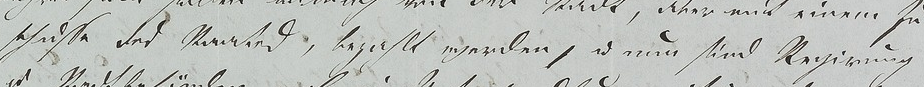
schusse des Staates, bezahlt werden, u nun sind Regirung
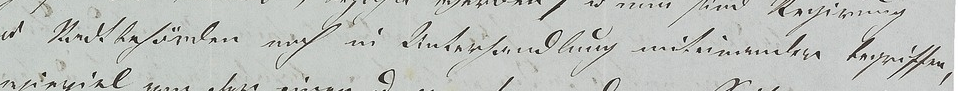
u Stadtbehörden noch in Unterhandlung miteinander begriffen,
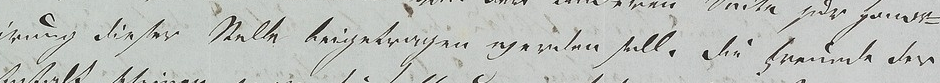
irung dieser Stelle beigetragen werden soll. Die Freunde der
